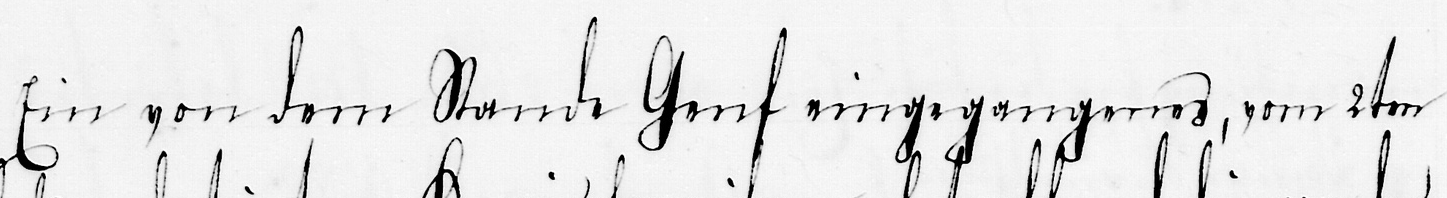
Ein von dem Stande Genf eingegangenes, vom 2ten
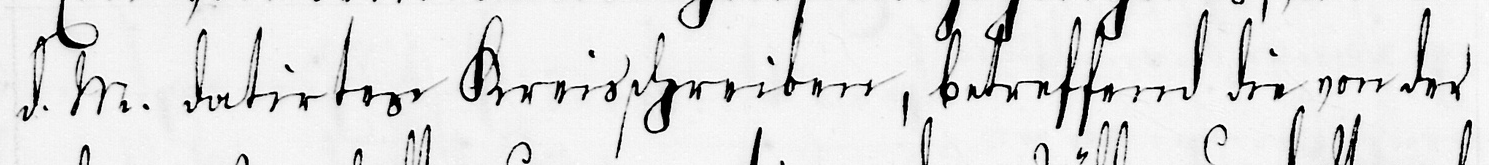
d. M. datirtes Kreisschreiben, betreffend die von der
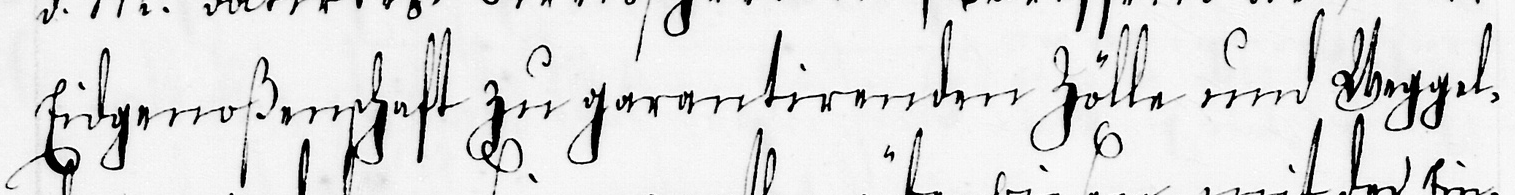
Eidgenoßenschaft zu garantirenden Zölle und Weggel¬
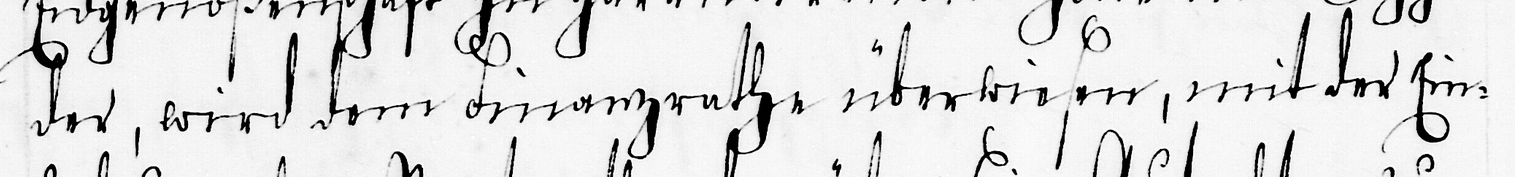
der, wird dem Finanzrathe überwiesen, mit der Ein¬
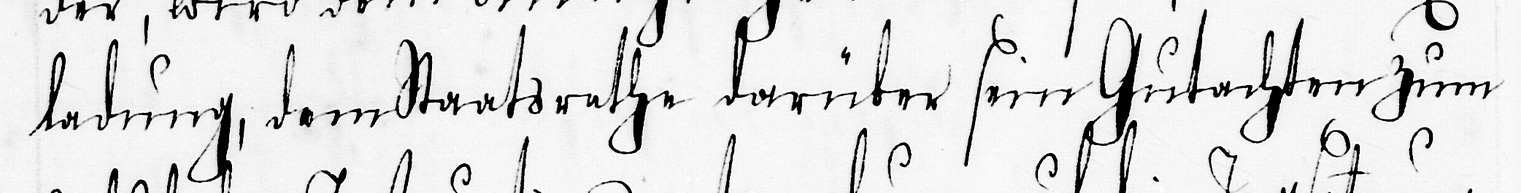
ladung, dem Staatsrathe darüber sein Gutachten zum
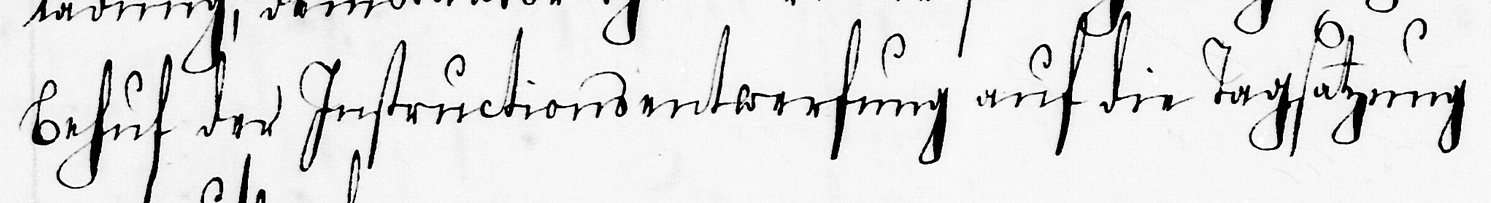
Behuf der Instructionsentwerfung auf die Tagsatzung
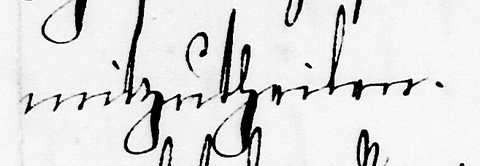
mitzutheilen.
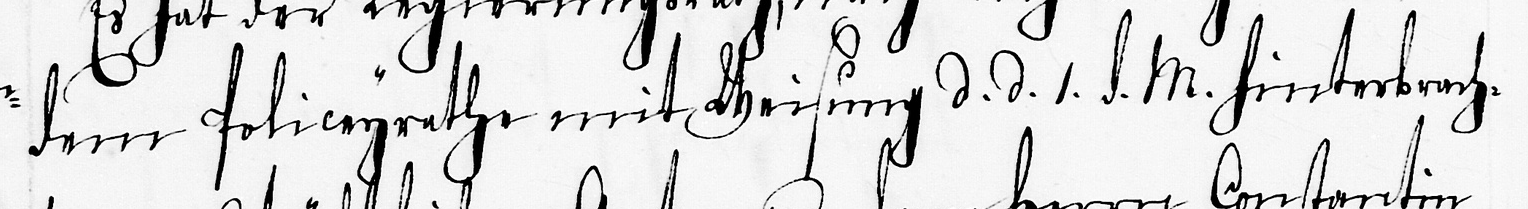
dem Policeyrathe mit Weisung d. d. 1. d. M. hinterbrach¬
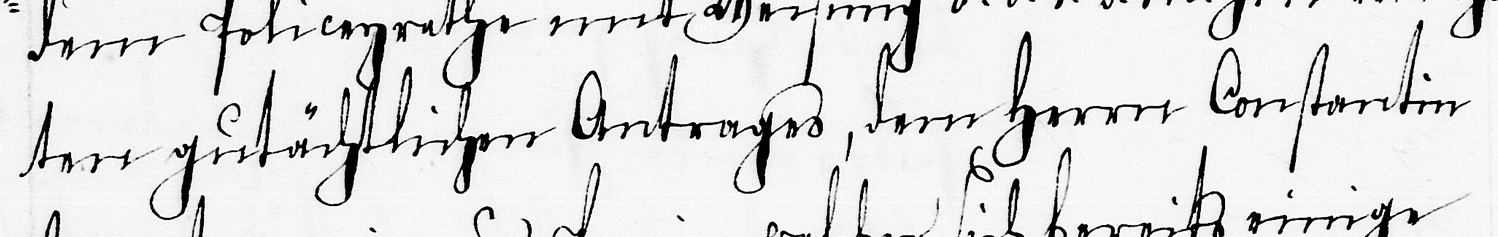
ten gutächtlichen Antrages, dem Herrn Constantin
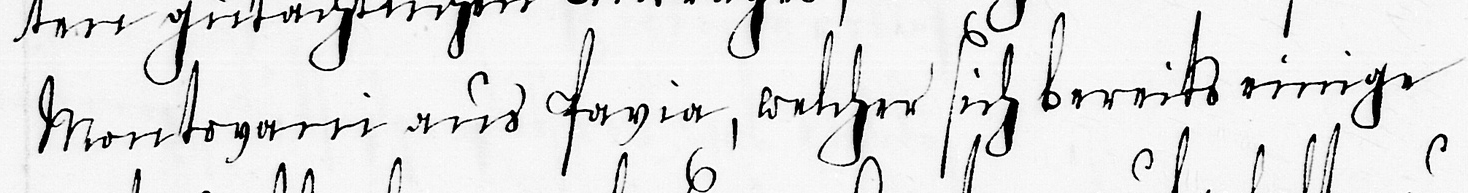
Montovani aus Pavia, welcher sich bereits einige
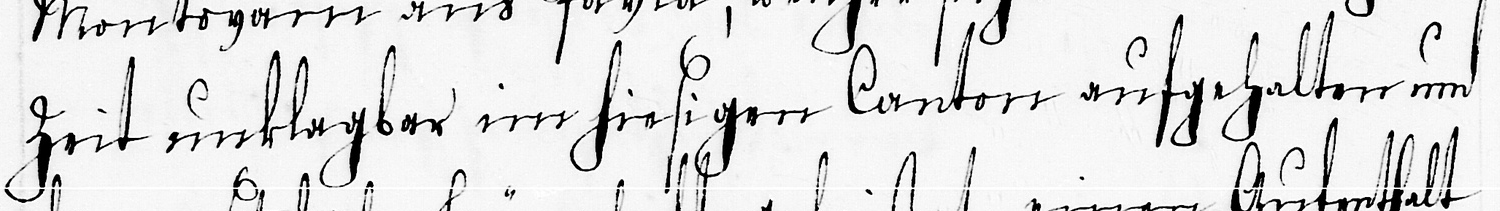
Zeit unklagbar im hiesigen Canton aufgehalten und
